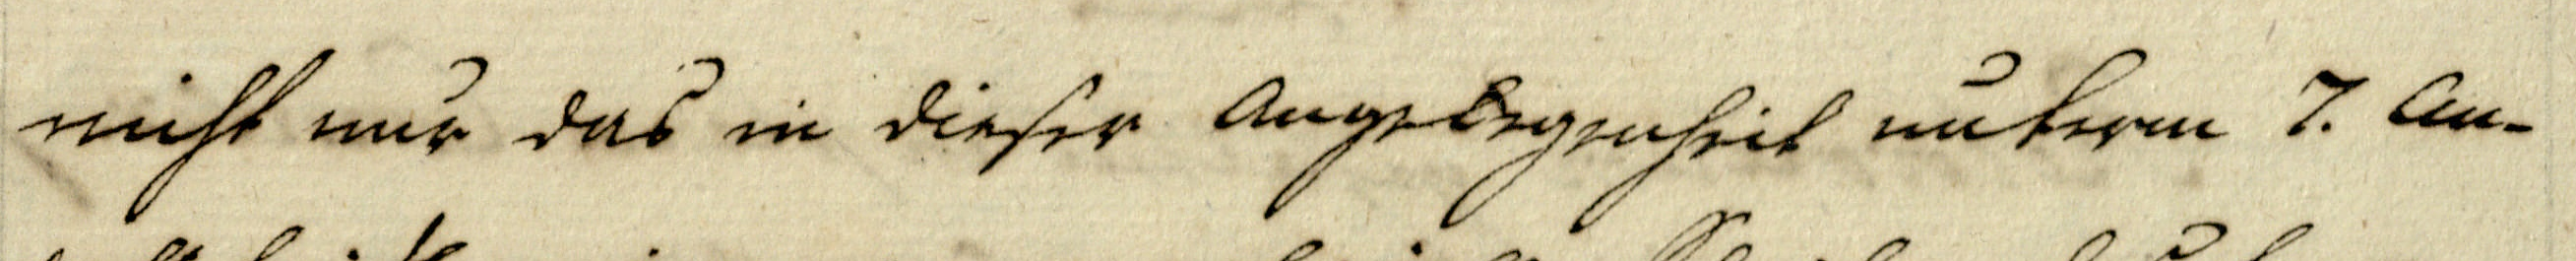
nicht nur das in dieser Angelegenheit unterm 7. Au¬
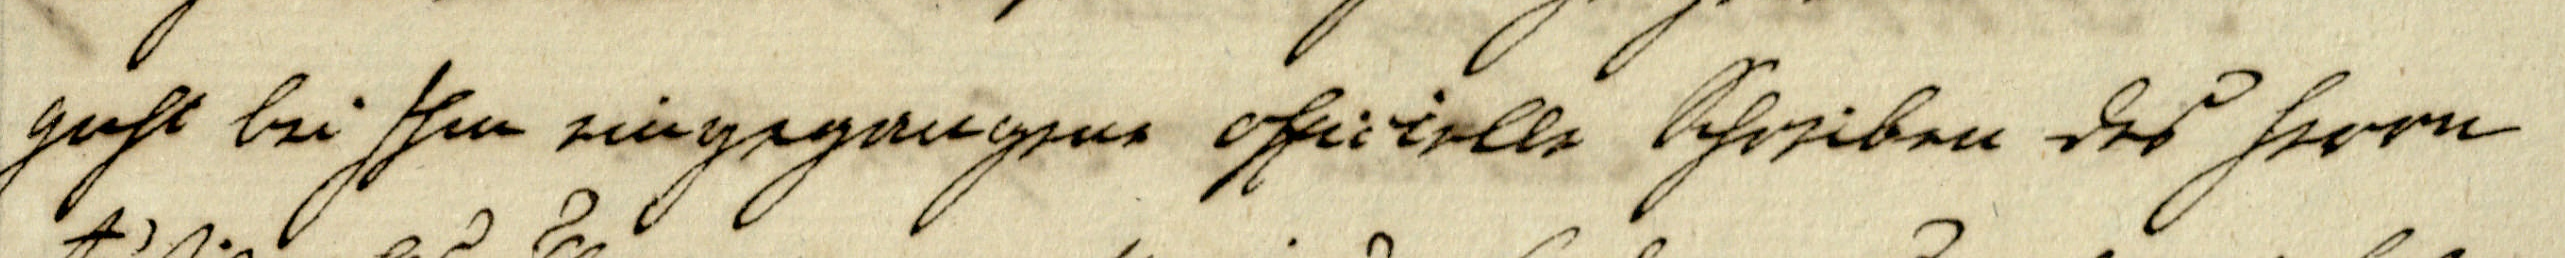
gust bei Ihm eingegangene officielle Schreiben des Herrn
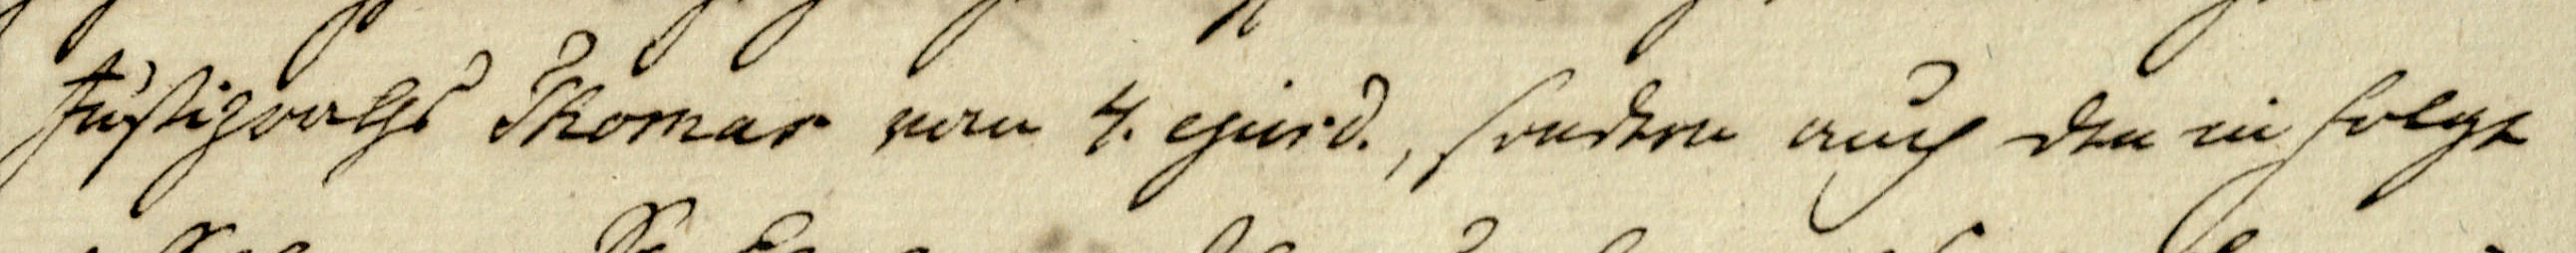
Justizraths Thomas vom 4. ejusd., sondern auch den in Folge
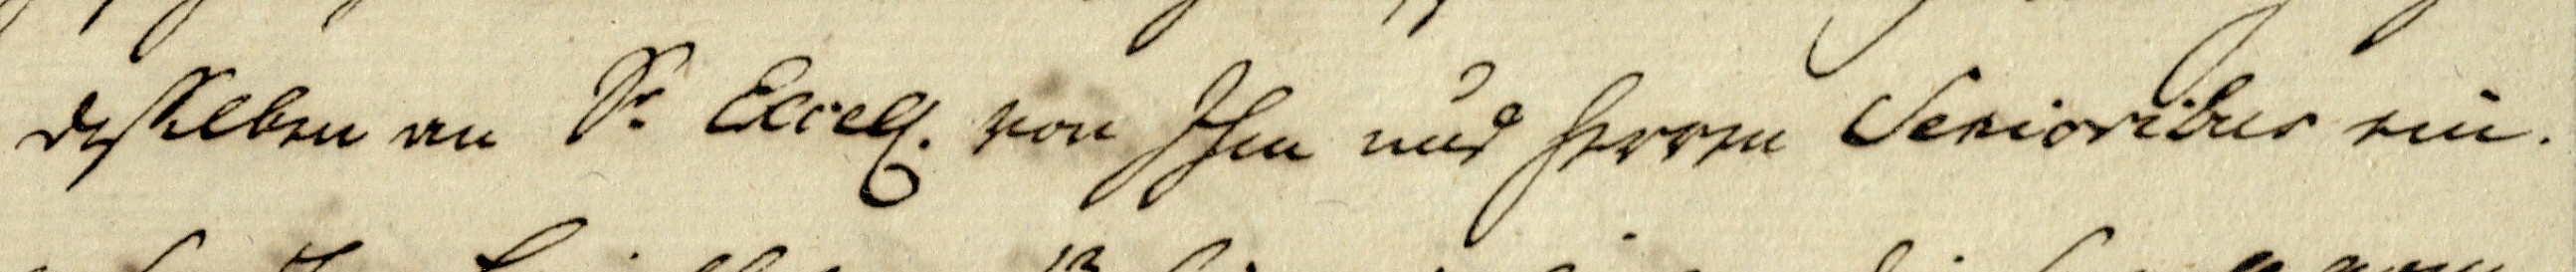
desselben an Sr Excell. von Ihm und Herren Senioribus ein¬
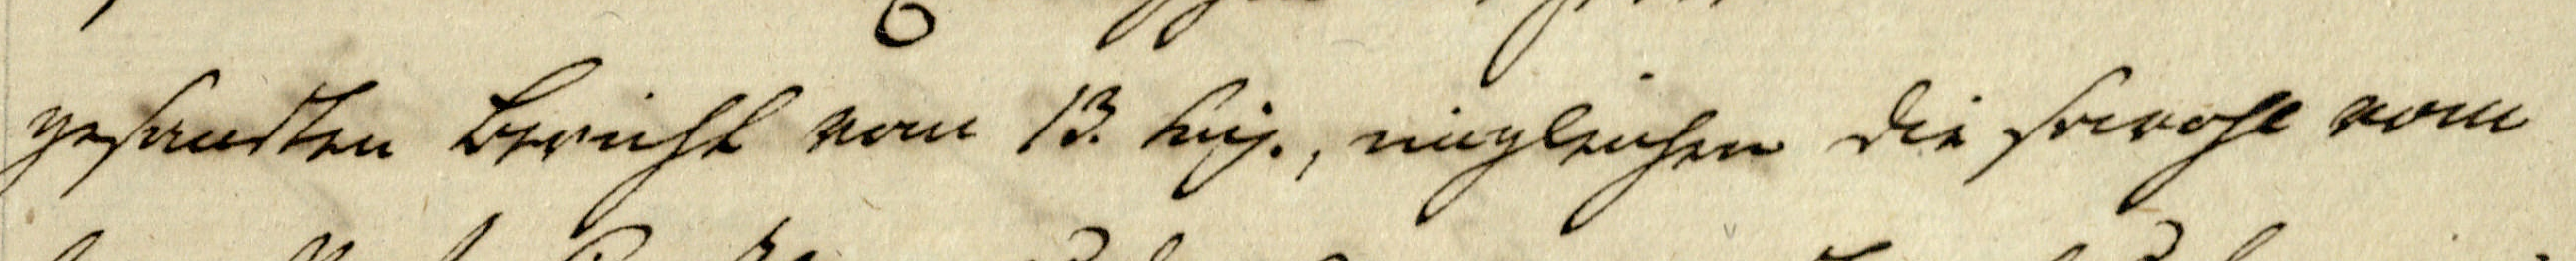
gesandten Bericht vom 13. huj., imgleichen die sowohl vom
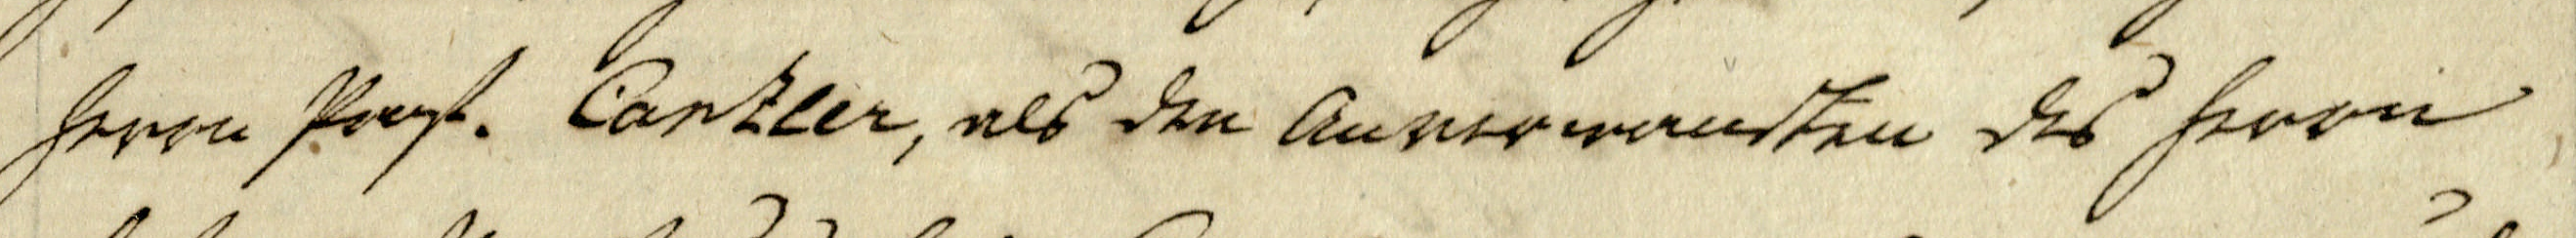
Herrn Prof. Canzler, als den Anverwandten des Herrn
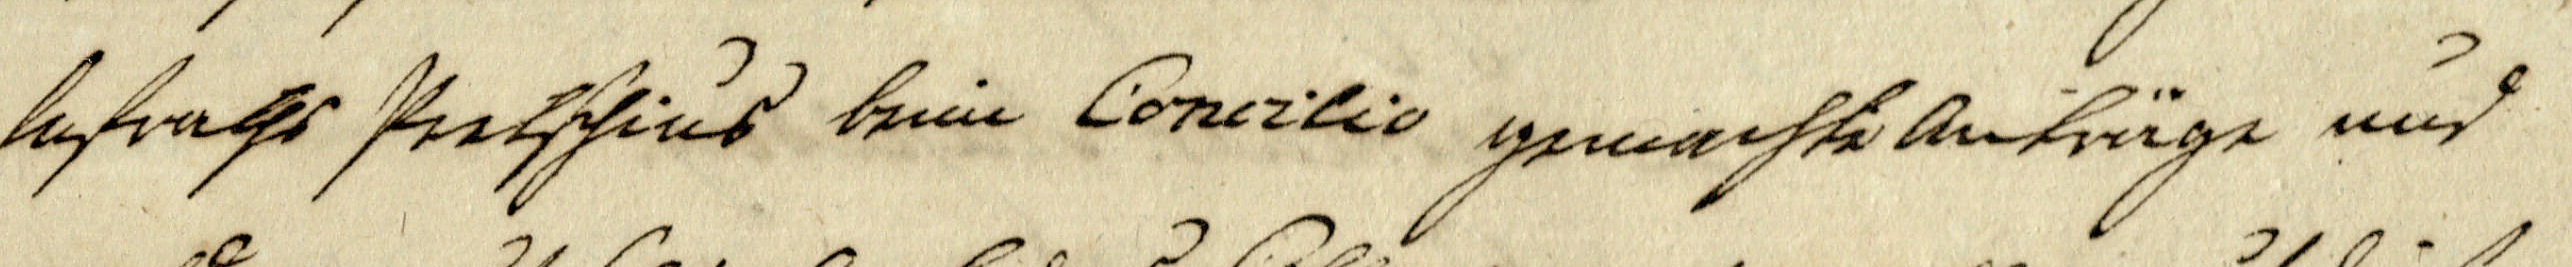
Hofraths Peetschius beim Concilio gemachte Anträge und
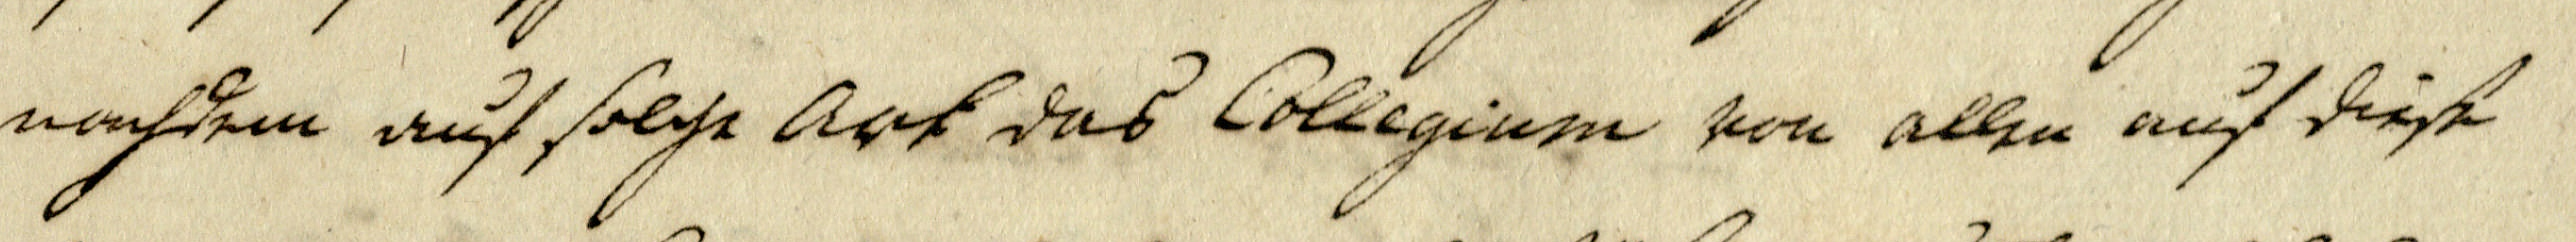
nachdem auf solche Art das Collegium von allen auf diese
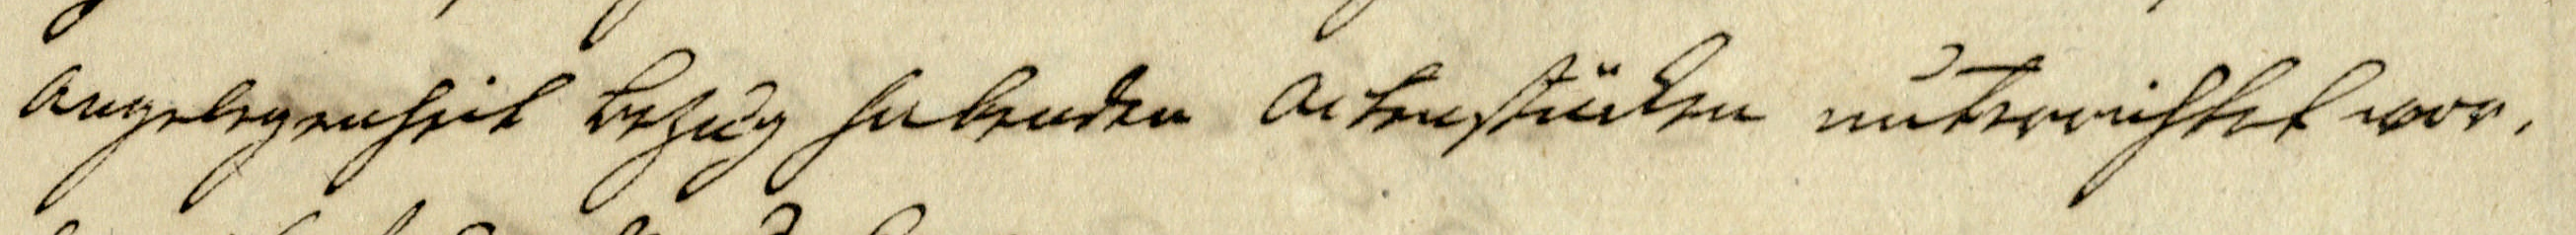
Angelegenheit Bezug habenden Actenstücken unterrichtet wor¬
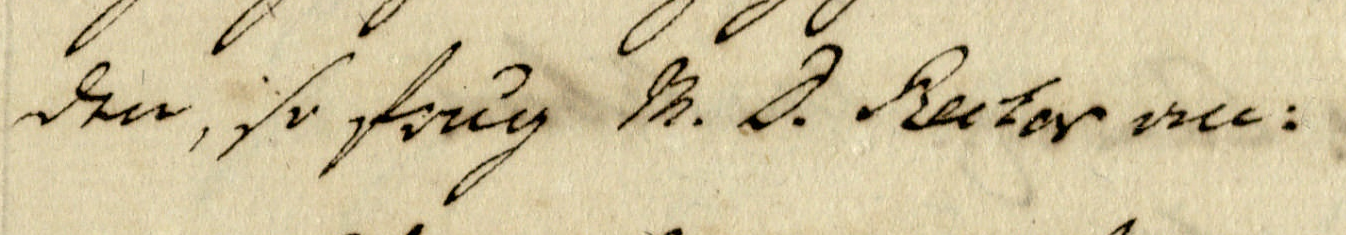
den, so frug M. D. Rector an:
